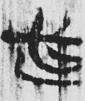必
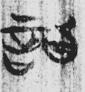○（約）
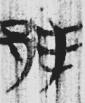邦
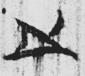之
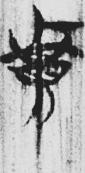貴
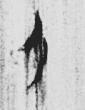人
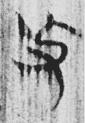及
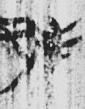邦
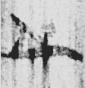之
